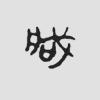戕
